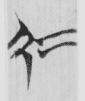𡰥
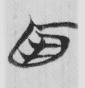西
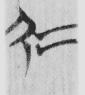𡰥
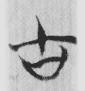古
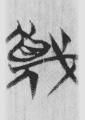蔑
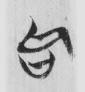句
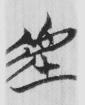𫊟
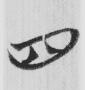四
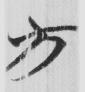方
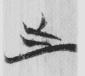之
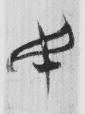民
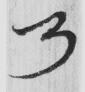乃
